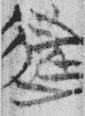○（往）
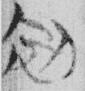初
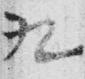九
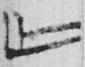亡（无）
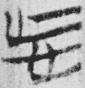忘
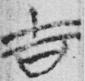吉
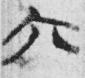六
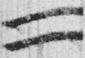二
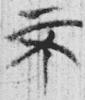不
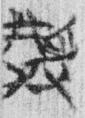○（耕）
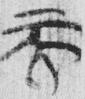而
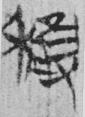○（穫）
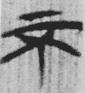不
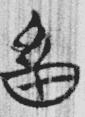畜
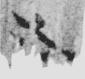之
